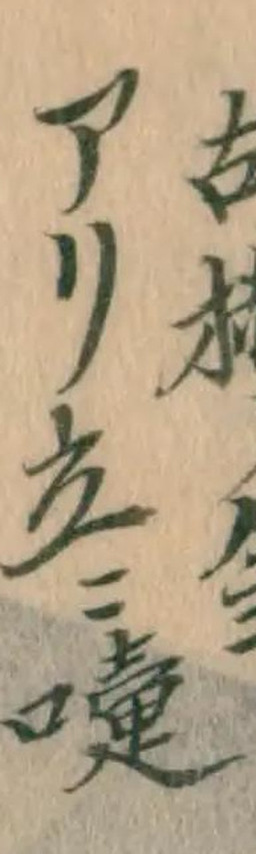アリ立ニ嚏
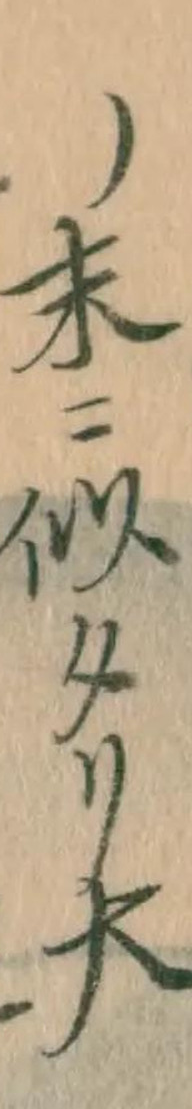ノ末ニ似タリ大
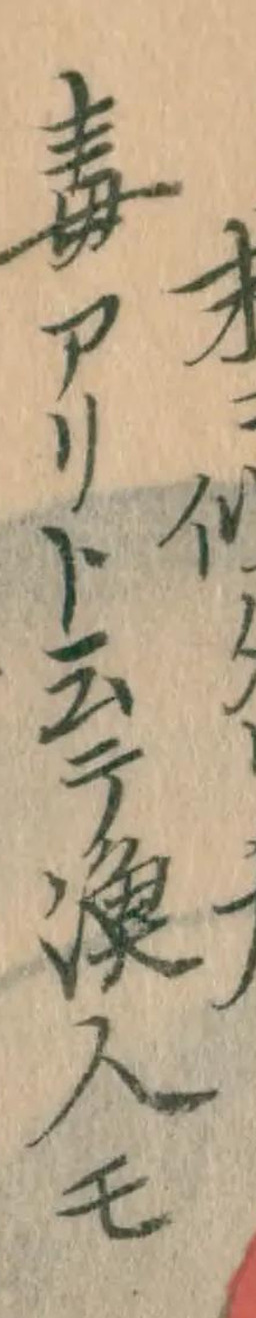毒アリト云テ漁人モ
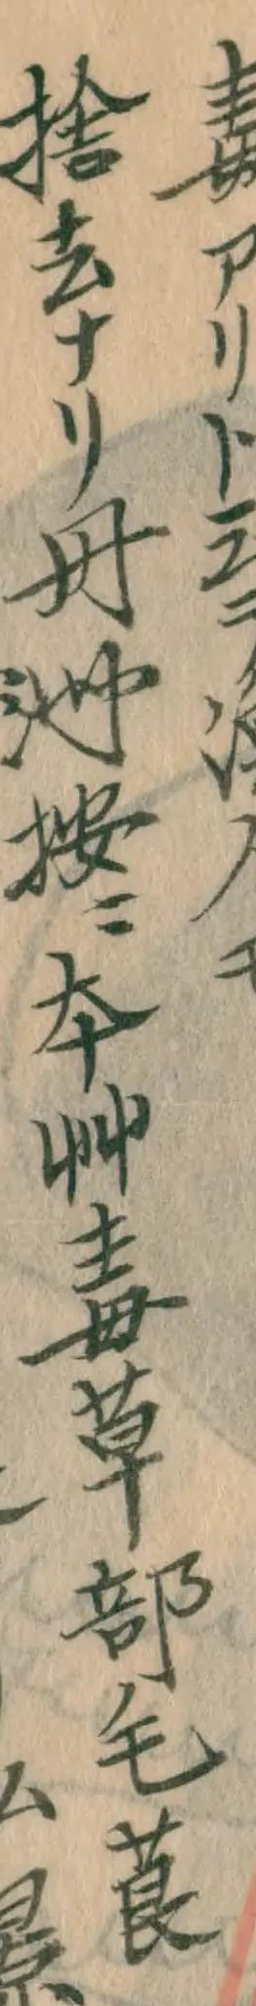捨去ナリ丹洲按ニ本艸毒草部毛茛
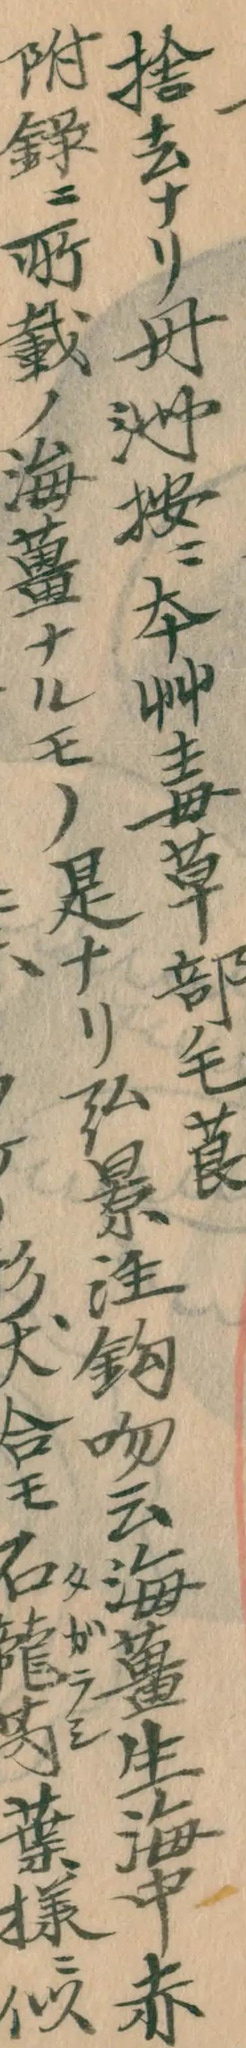附録ニ所載ノ海薑ナルモノ是ナリ弘景注鈎粉吻云海薑生海中赤
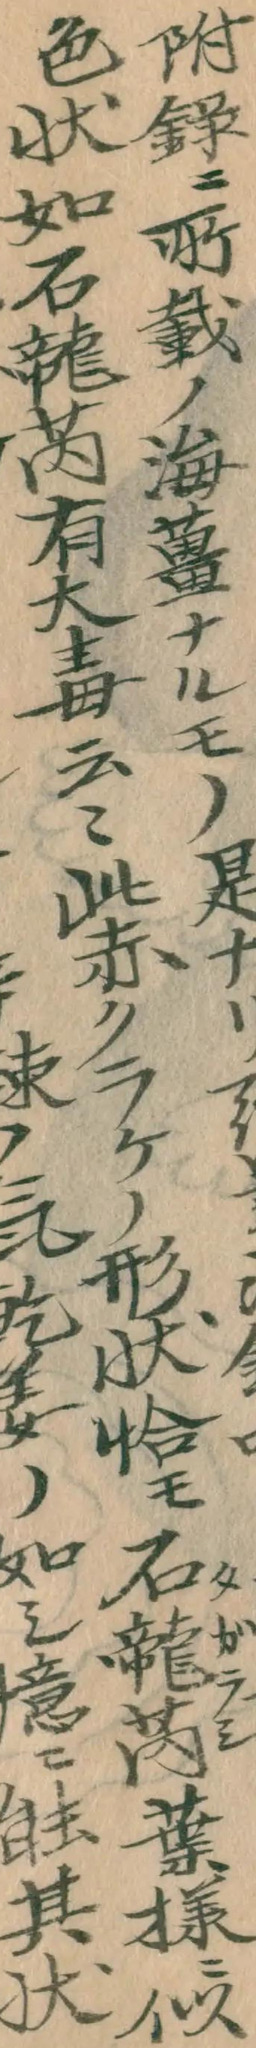色状如石㡣芮有大毒云々此赤クラケノ形状恰モ石㡣芮葉様ニ似
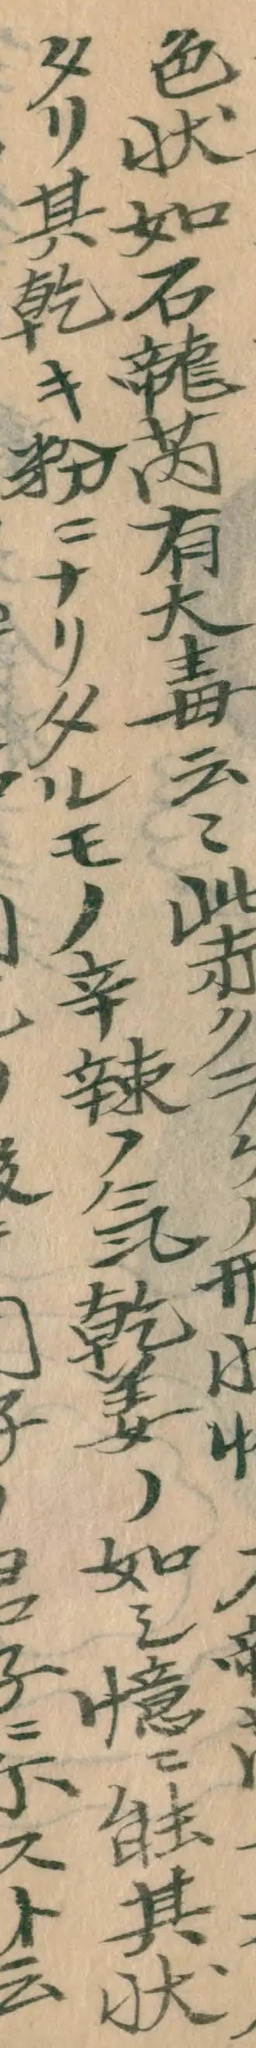タリ其乾キ粉ニナリタルモノ辛辣ノ気乾姜ノ如シ憶ニ能其状
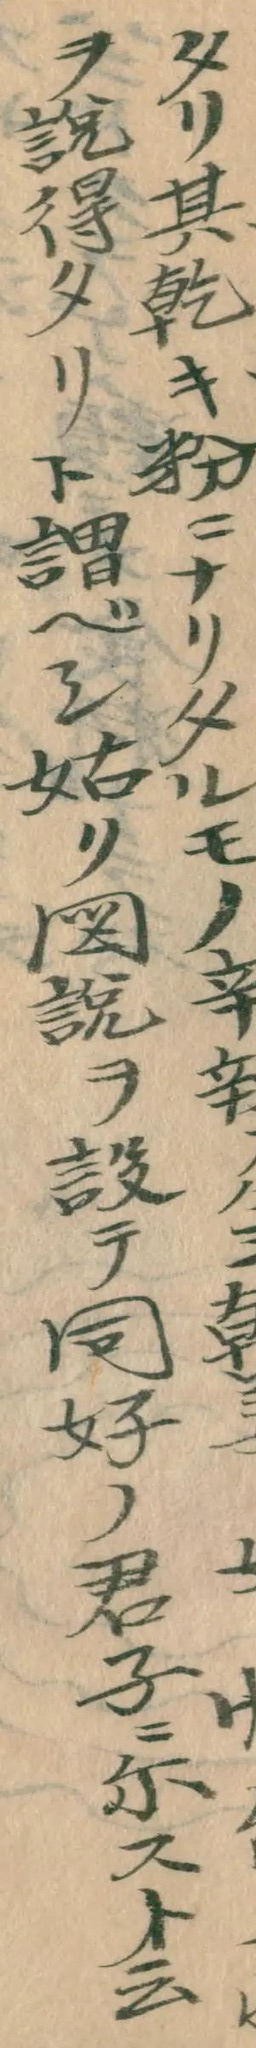ヲ説得タリト謂ベシ姑ク図説ヲ設テ同好ノ君子ニ尓スト云

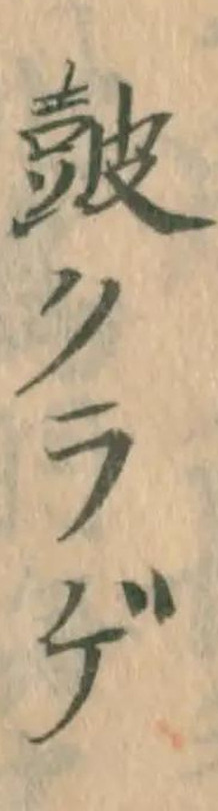皷クラゲ
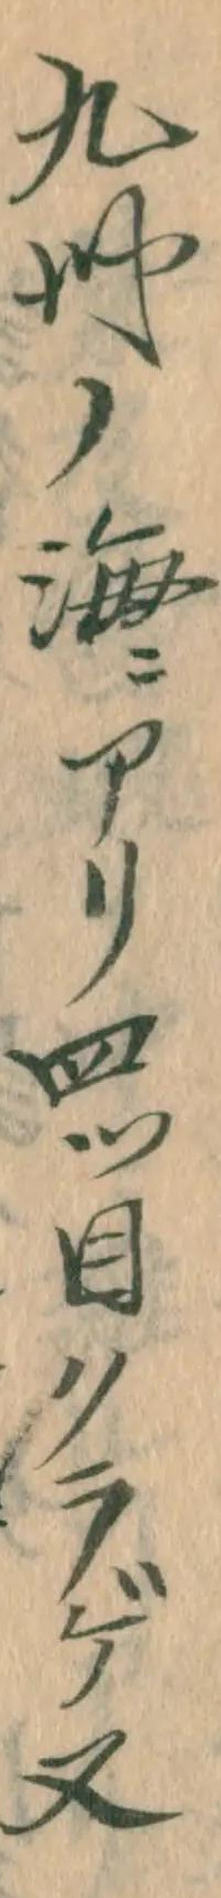九州ノ海ニアリ四ツ目クラゲ又

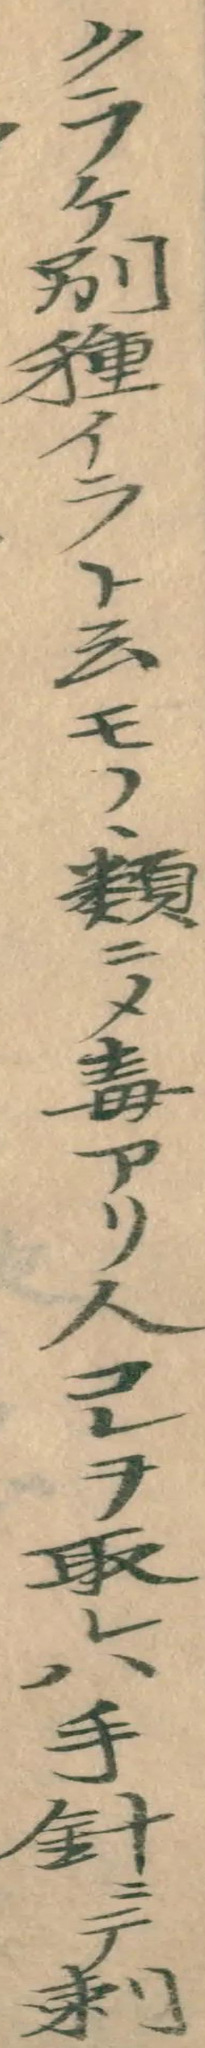クラケ別種イラト云モノヽ類ニシテ毒アリ人コレヲ取レハ手針ニテ刺
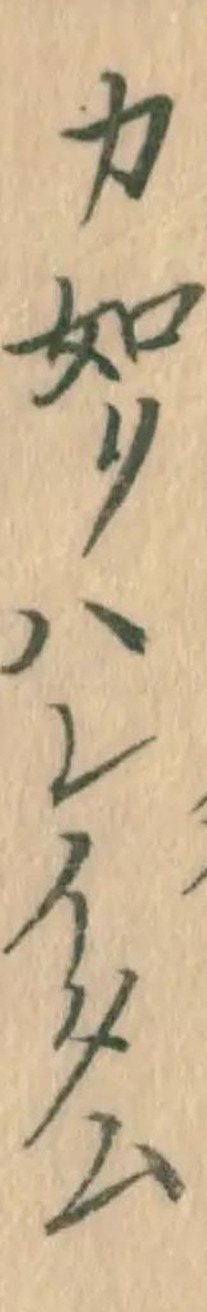カ如クハレイタム
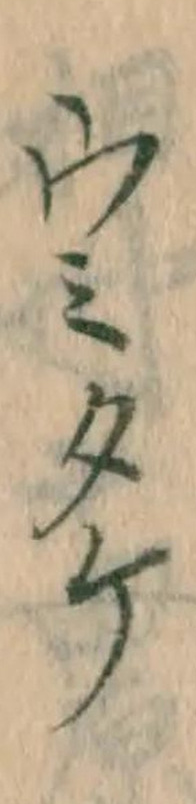ウミタケ

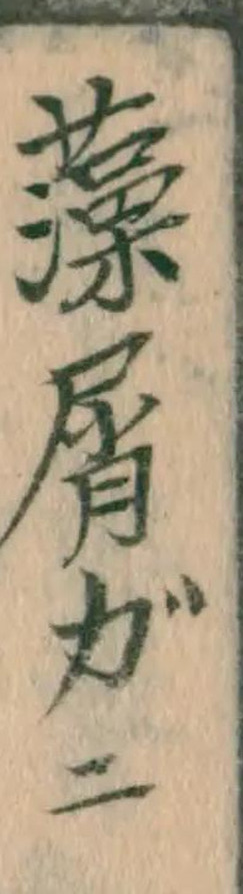藻屑ガニ
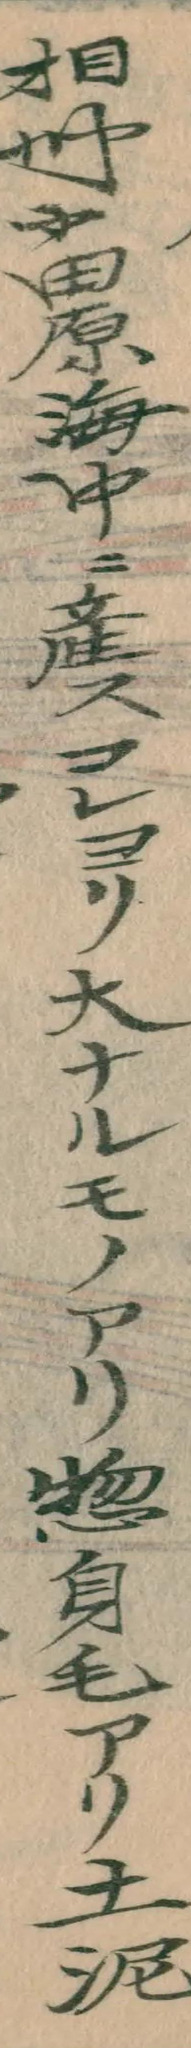相州小田原海中ニ産スコレヨリ大ナルモノアリ惣身毛アリ土泥
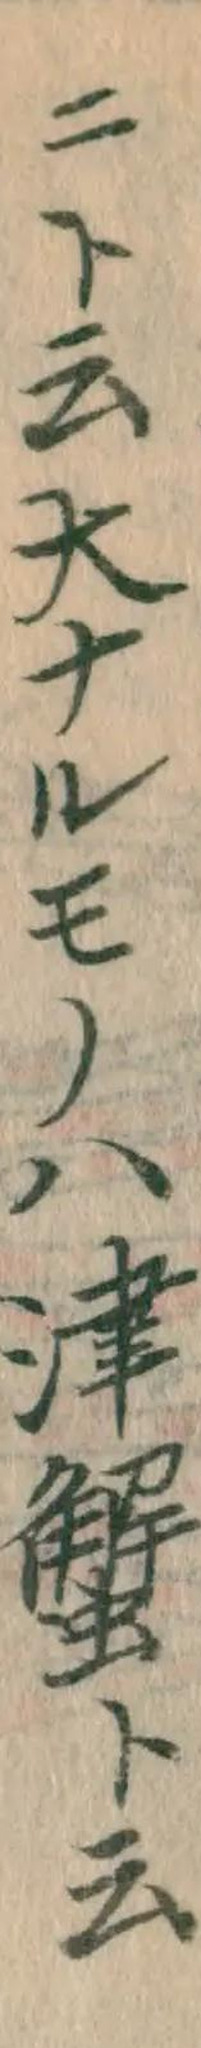ニト云大ナルモノハ津蟹ト云
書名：千蟲譜 3巻. [2]
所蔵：国立国会図書館 National Diet Library, JAPAN
